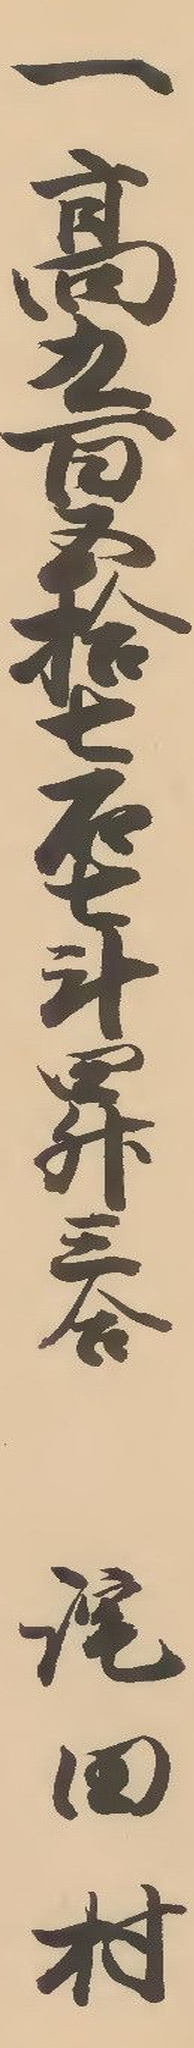一髙九百五拾七石七斗四升三合詫田村
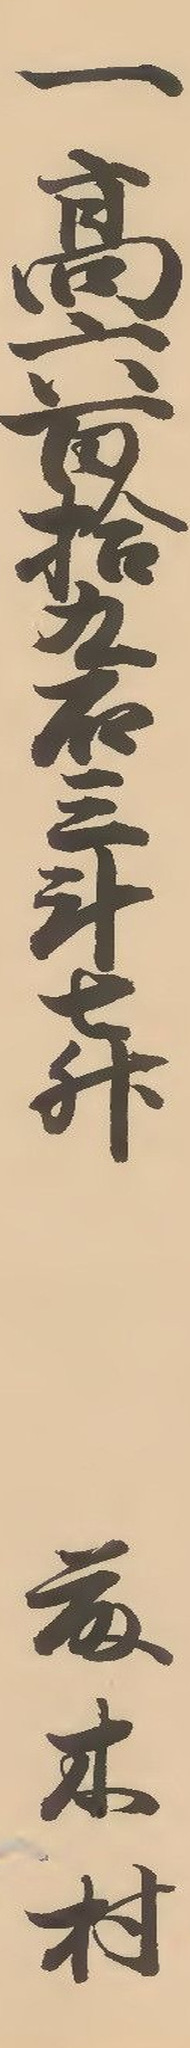一髙六百拾九石三斗七升藤木村
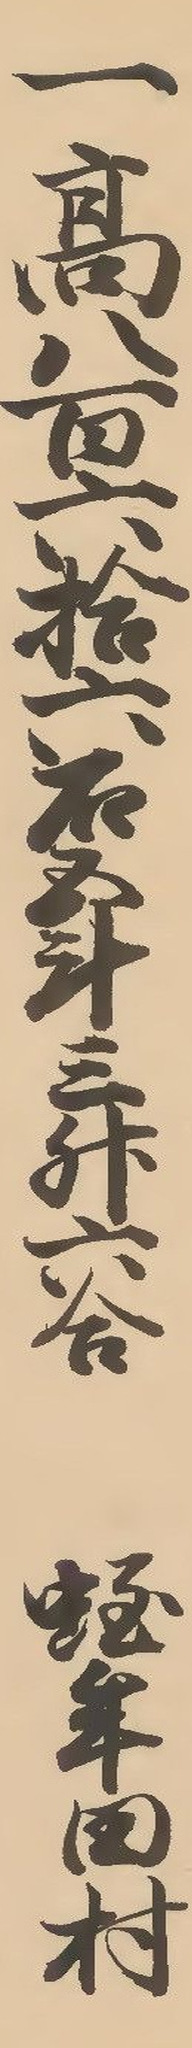一髙八百六拾六石五斗三升六合田村
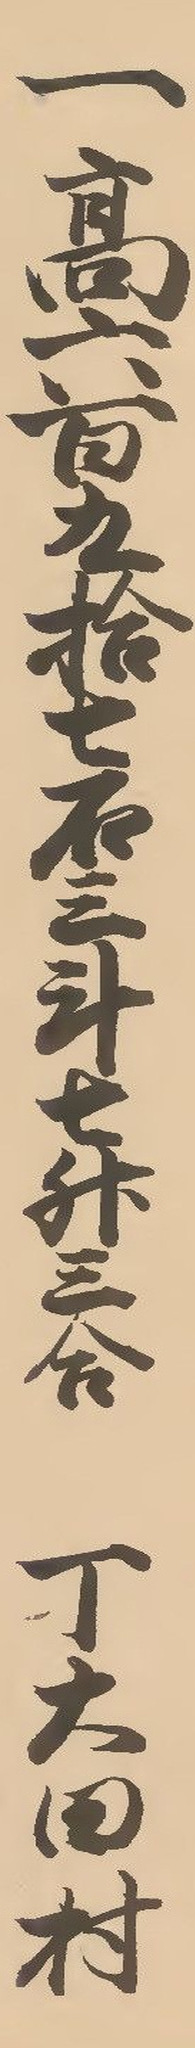一髙六百九拾七石村三斗七升三合丁大田村
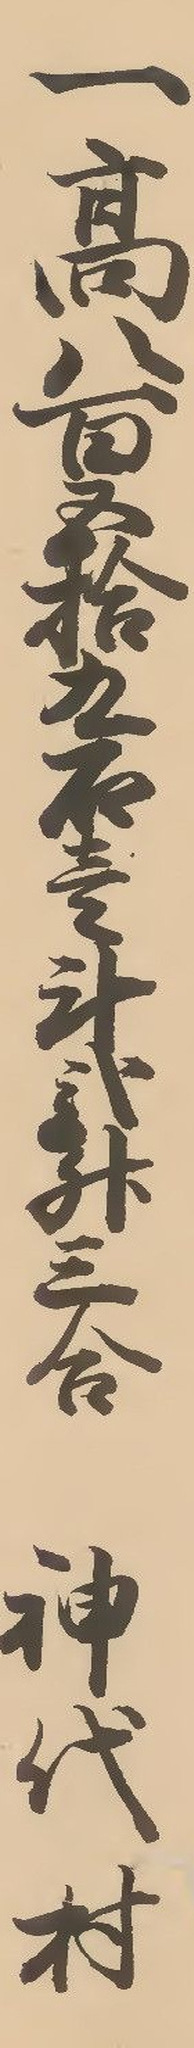一髙八百五拾九石壱斗弐升三合神代村
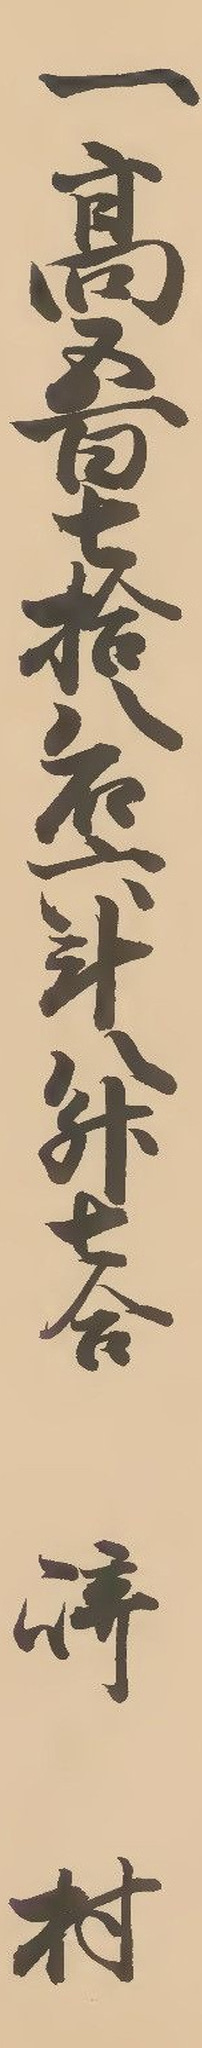一髙五百七拾八石六斗八升七合崎村
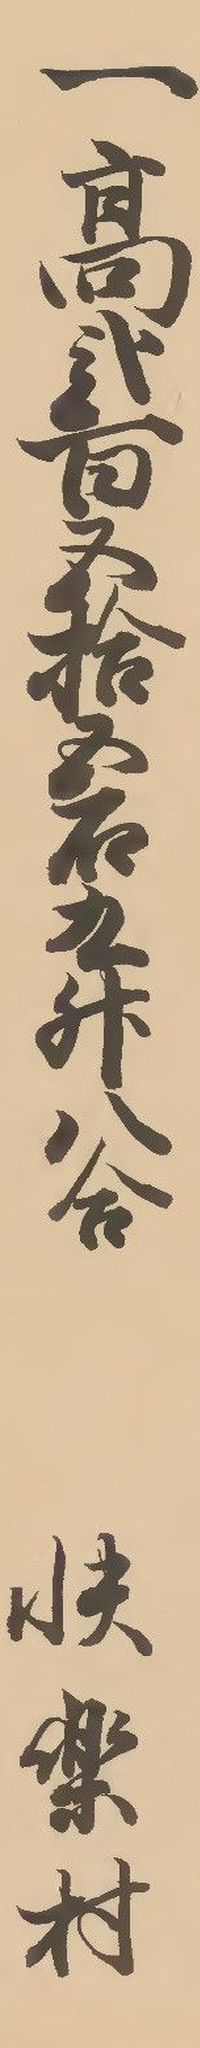一髙弐百五拾五石九升八合快樂村

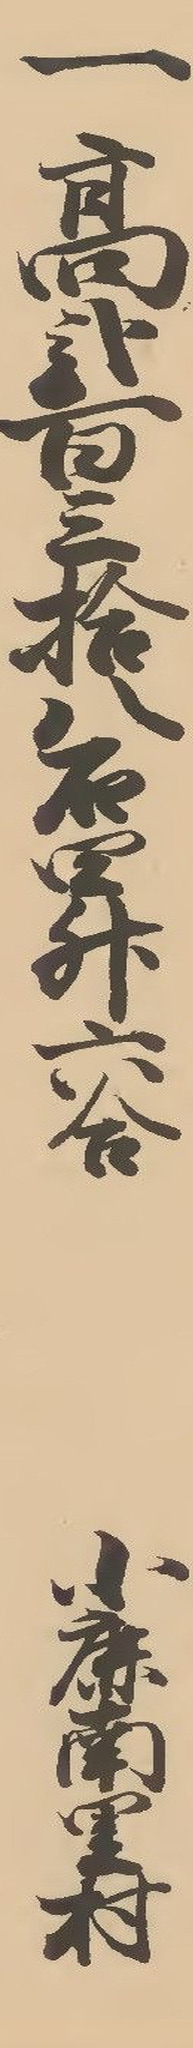一髙弐百三拾八石四升六合小鹿南里村
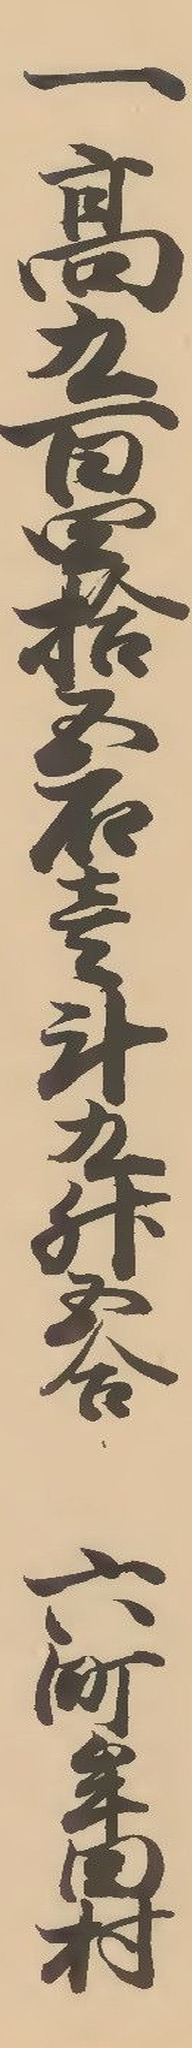一髙九百四拾五石壱斗九升五合六町牟田村
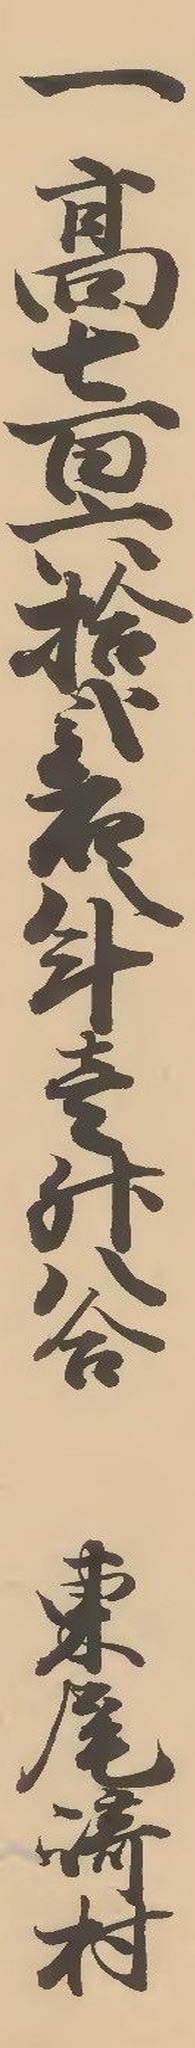一髙七百六拾弐石八斗壱升八合東尾崎村
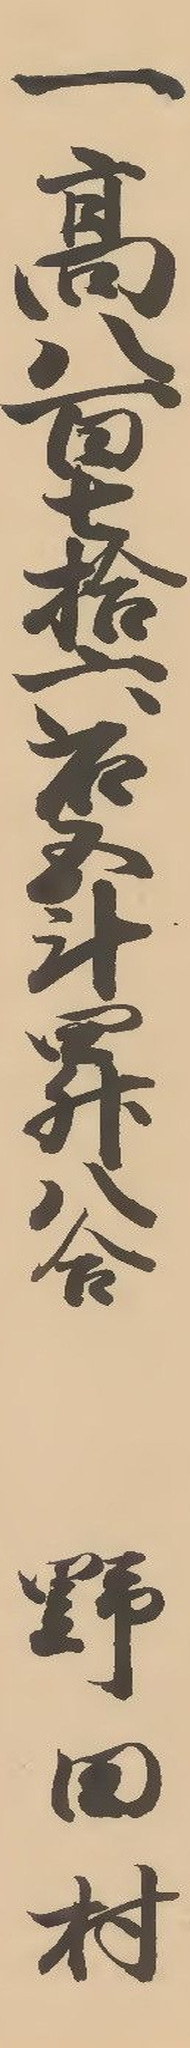一髙八百七拾六石五斗四升八合野田村
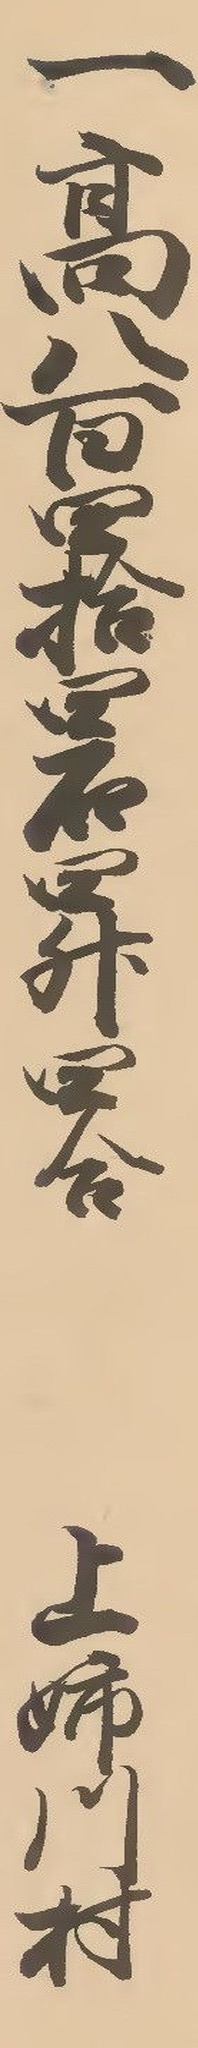一髙八百四拾四石四升四合上姉川村
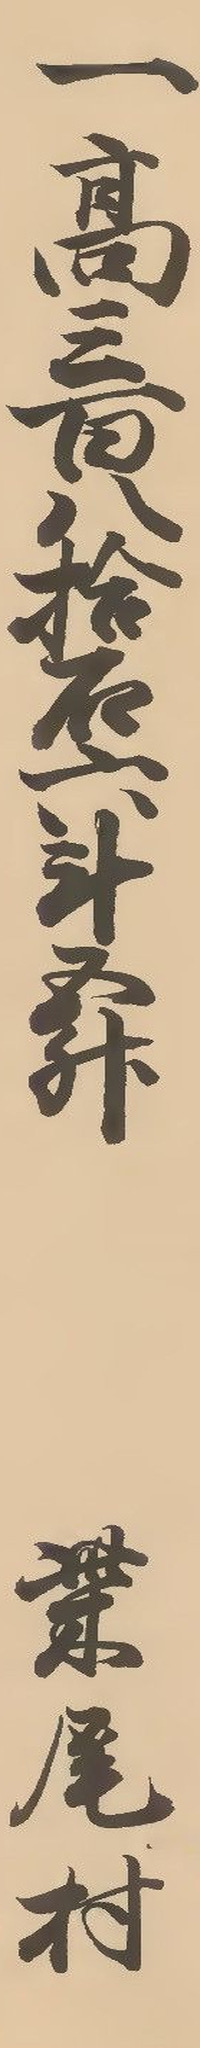一髙三百八拾石六斗五升尾村
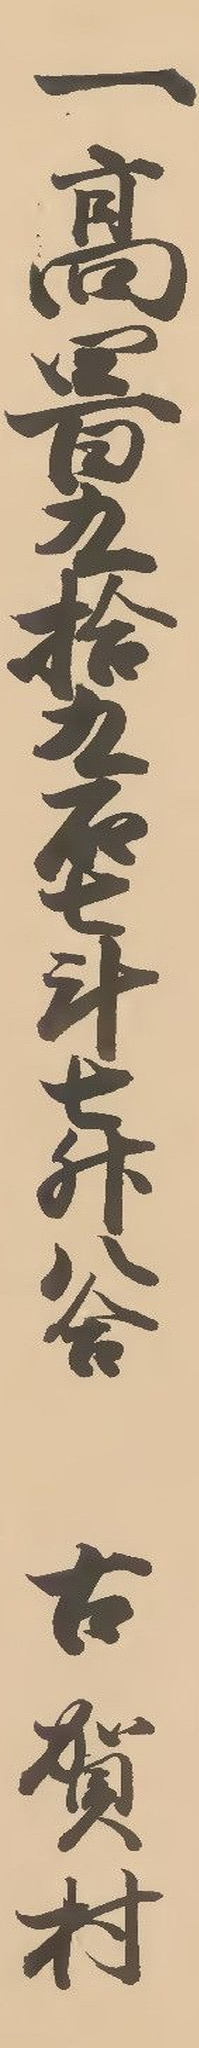一髙四百九拾九石七斗七升八合古賀村
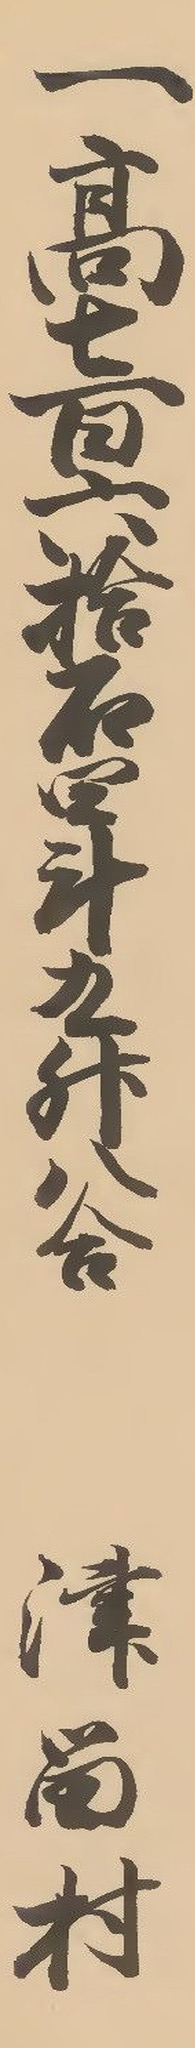一髙七百六拾石四斗九升八合津留村

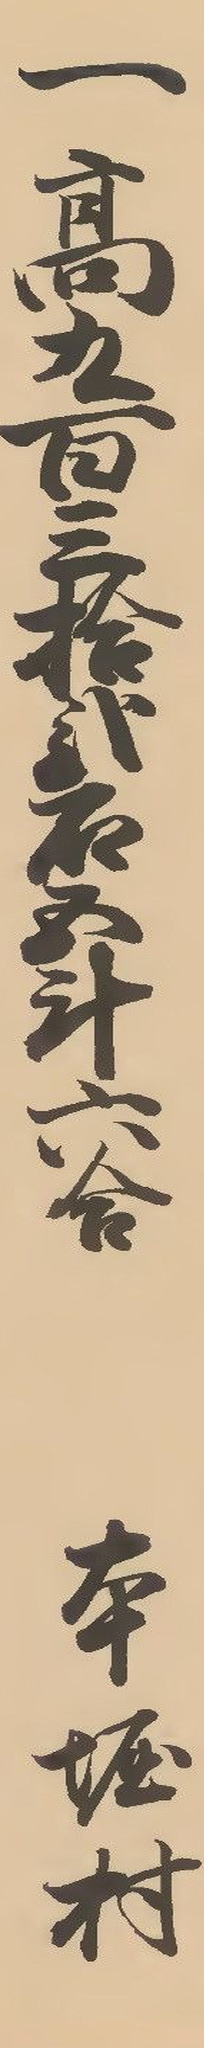一髙九百三拾弐石五斗六合本堀村
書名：肥前国郷帳
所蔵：国立公文書館 National Archives of Japan
